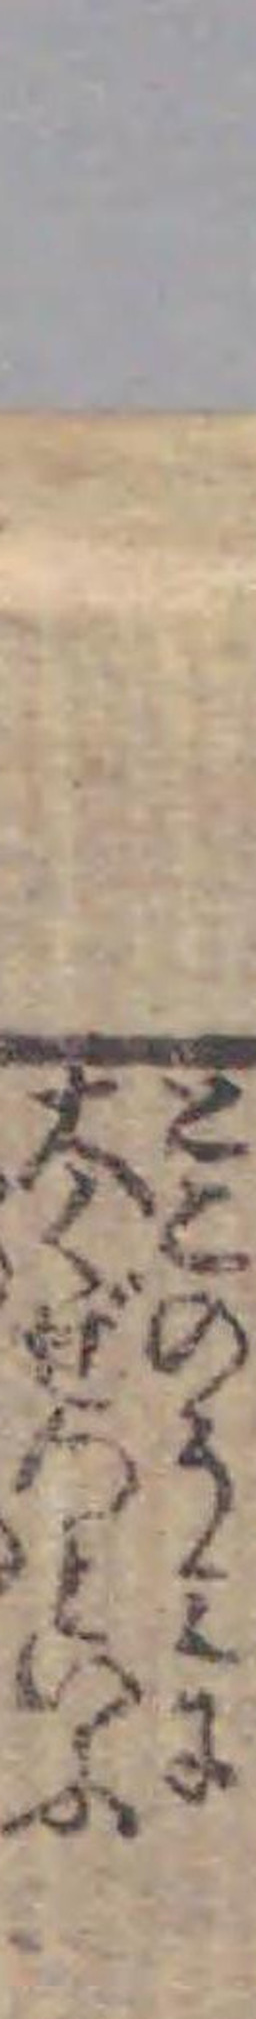大くぜつといふ
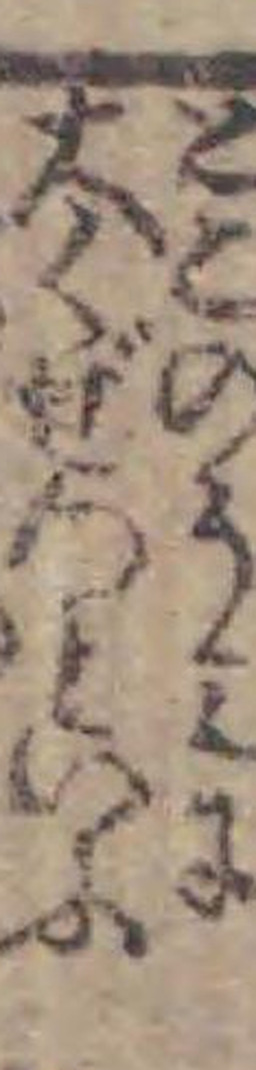大くぜつといふ
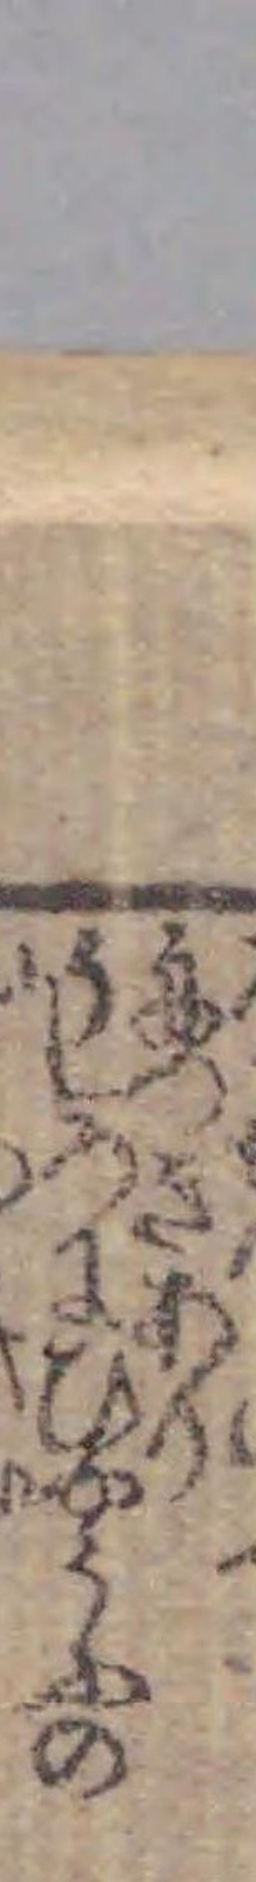うしろにひやうふの
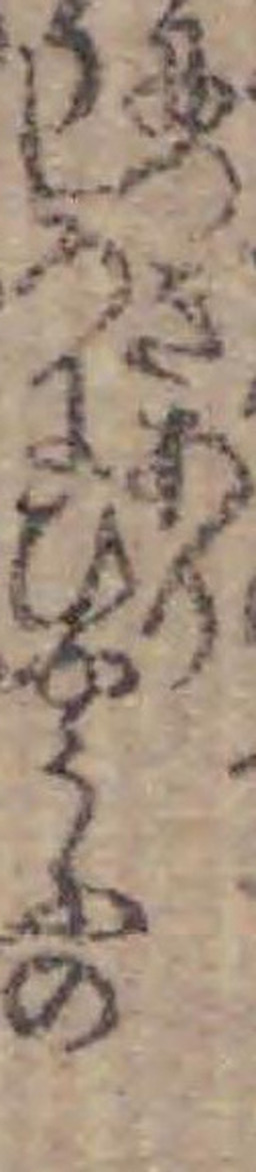うしろにひやうふの
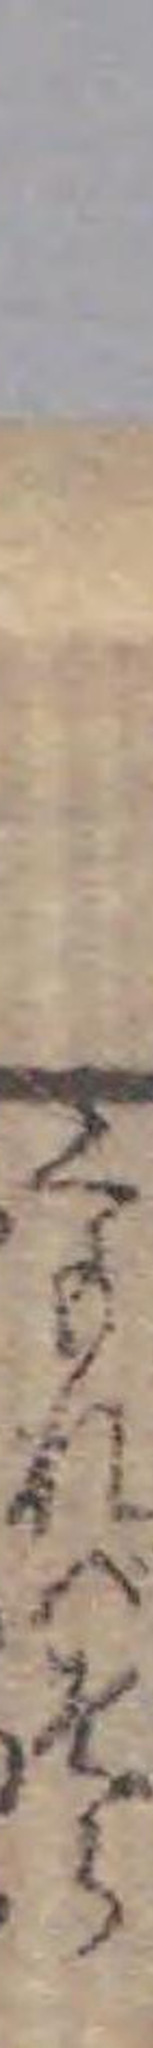くもればそら
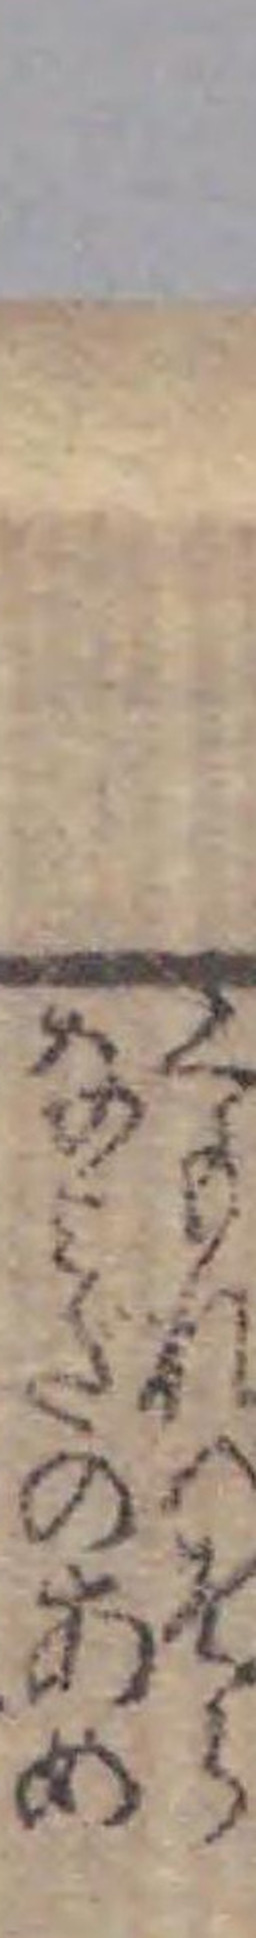なみだのあめ
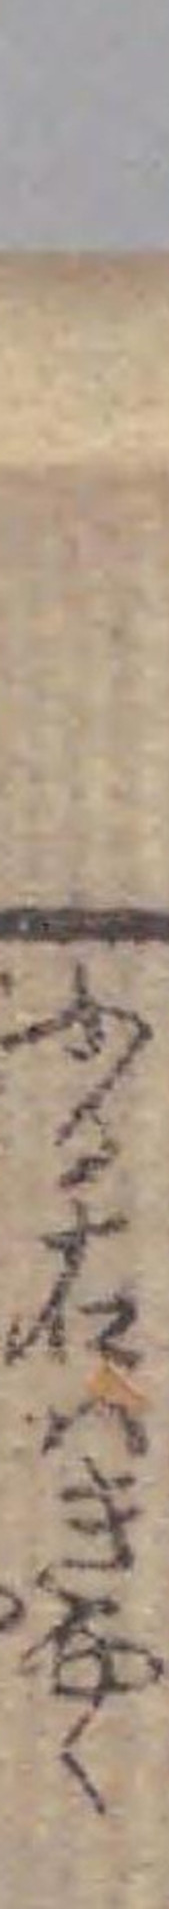ふる右はきやく
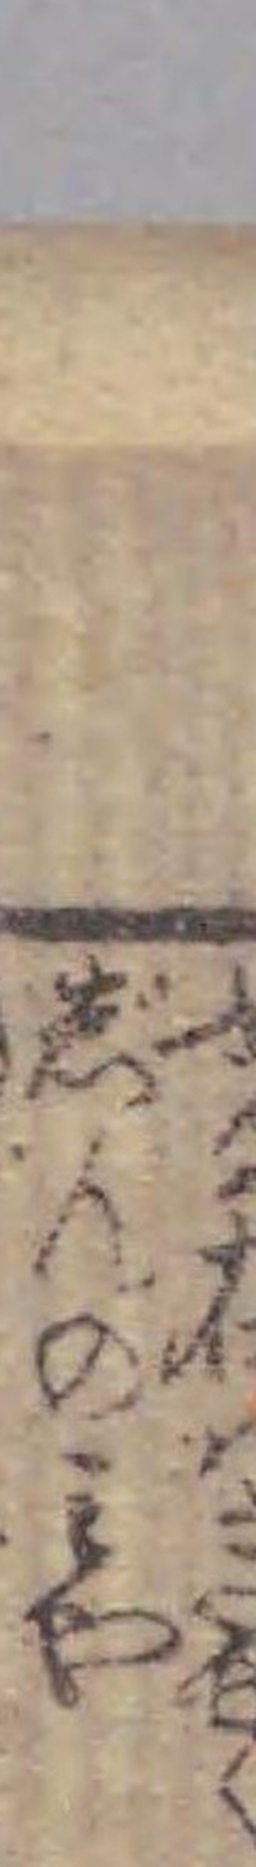じんのみや
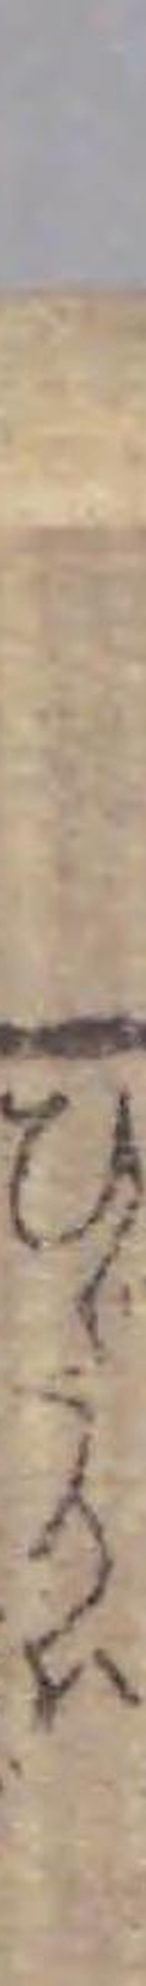ひだりは
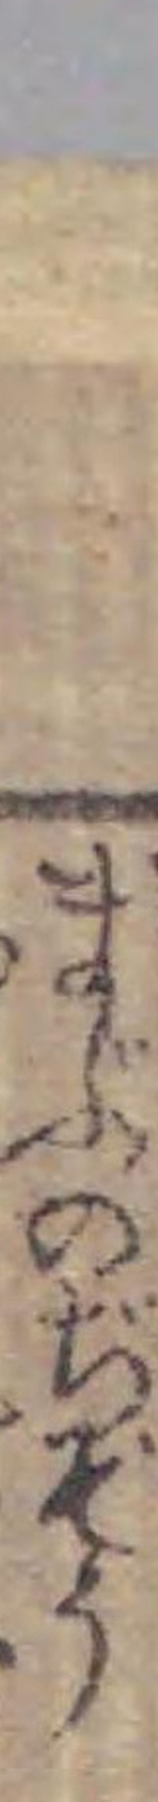まぶのぢぞう
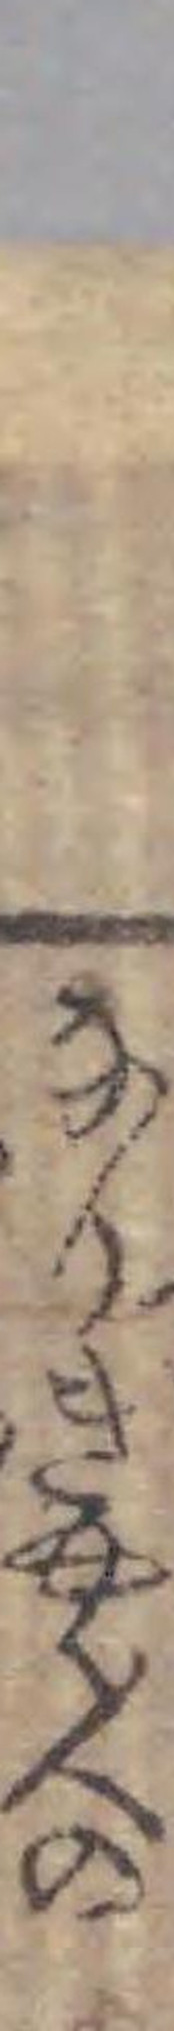なりきやく人の
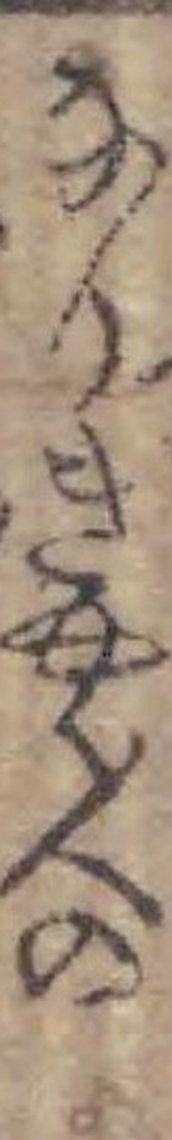なりきやく人の
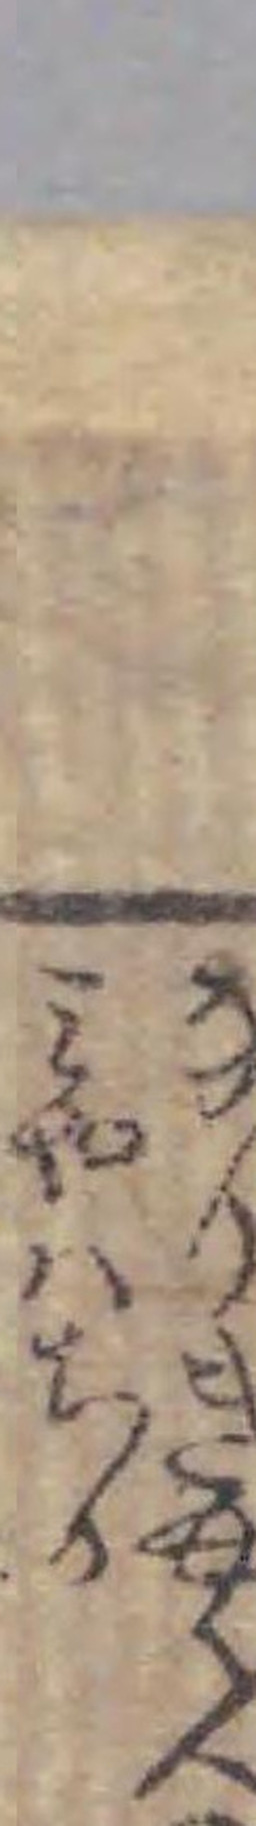みやはちか
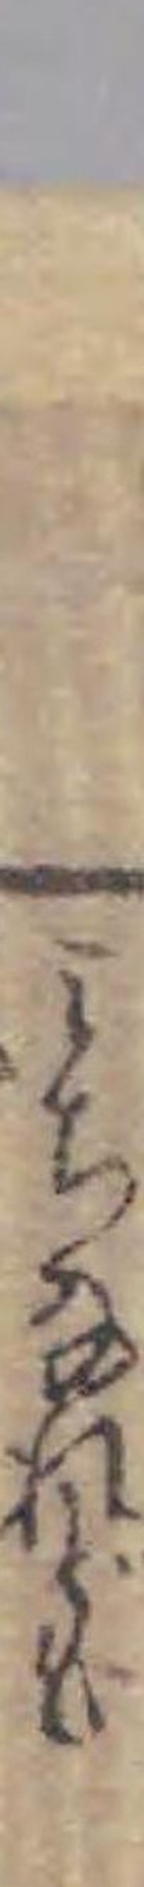みちなれども
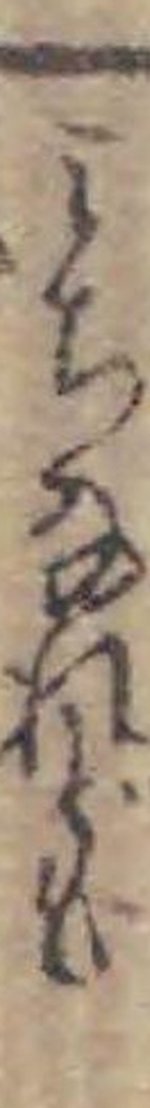みちなれども
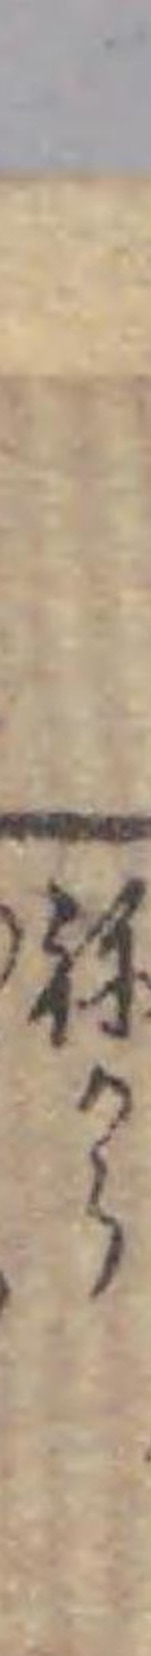ねから
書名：北国順礼唄方便 : 3巻
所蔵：国立国会図書館 National Diet Library, JAPAN
